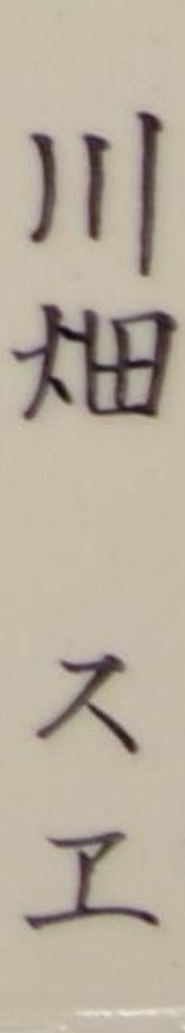川畑スエ
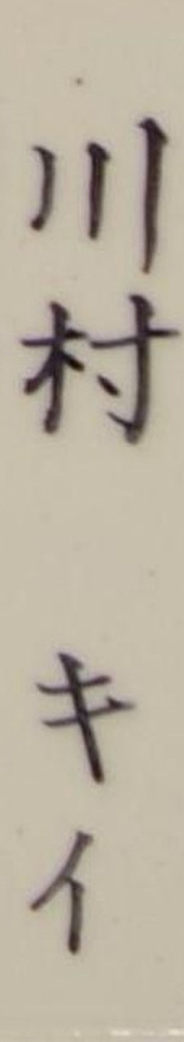川村キイ
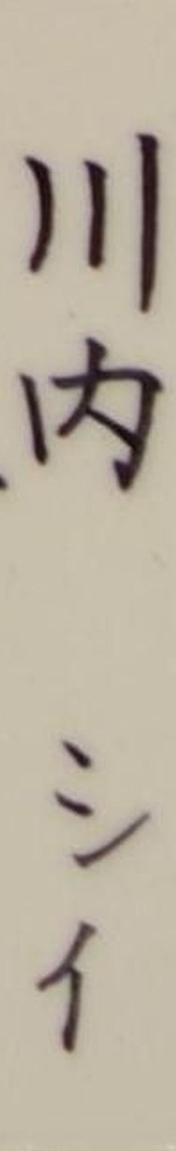川内シイ
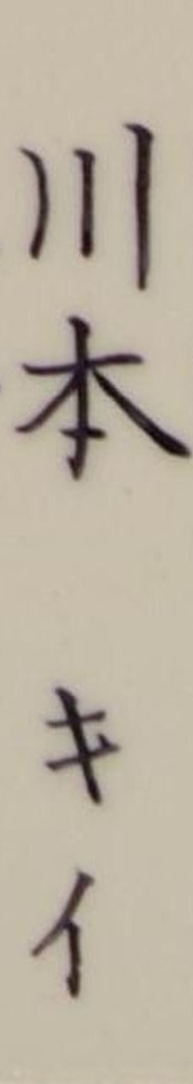川本キイ
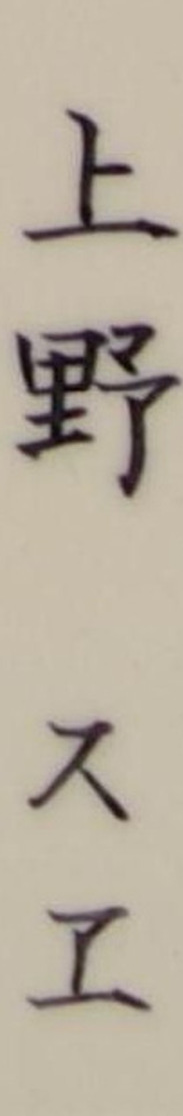上野スエ
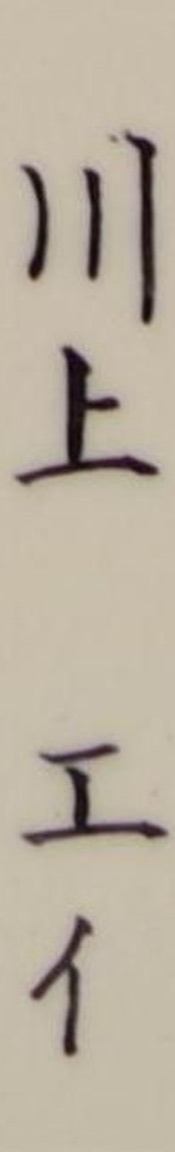川上エイ
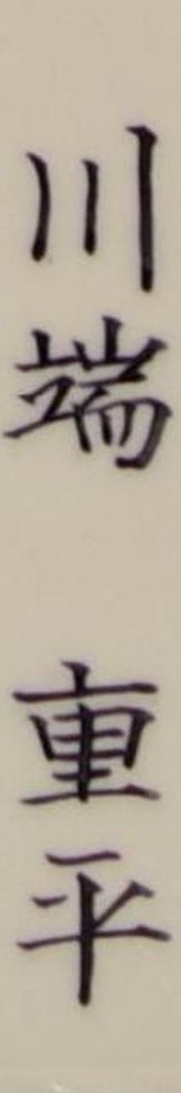川端重平
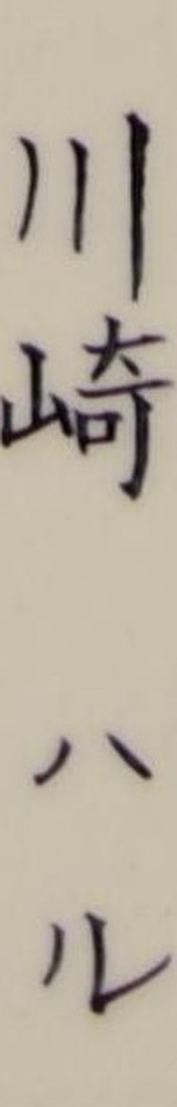川崎ハル
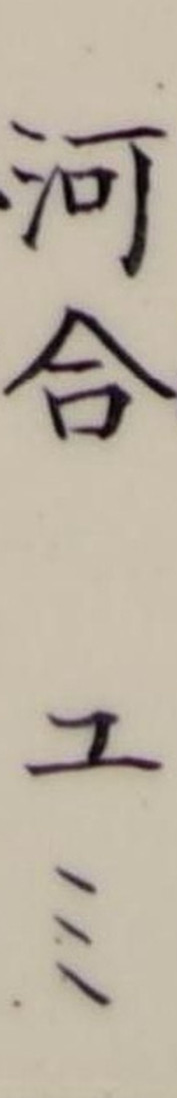河合ユミ
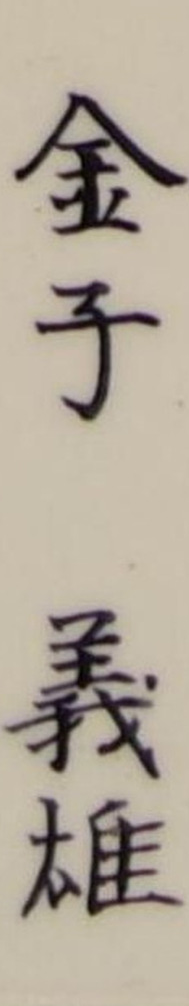金子義雄
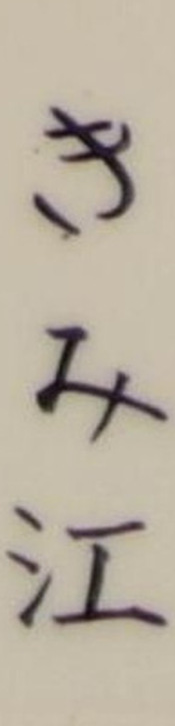きみ江
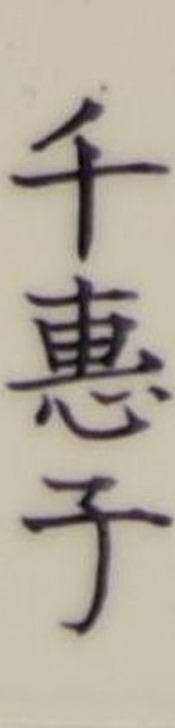千恵子
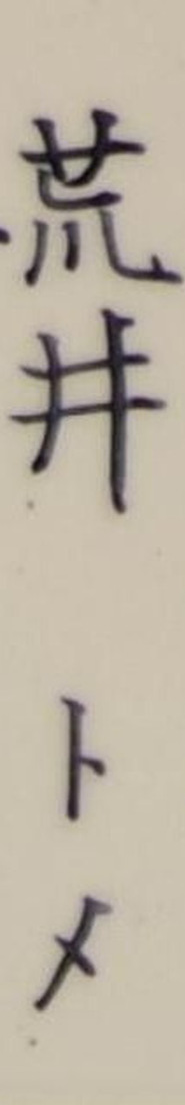荒井トメ
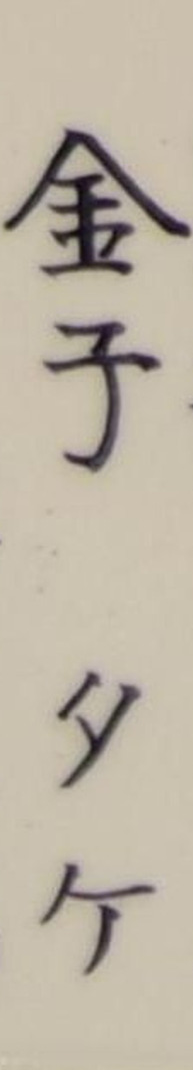金子タケ
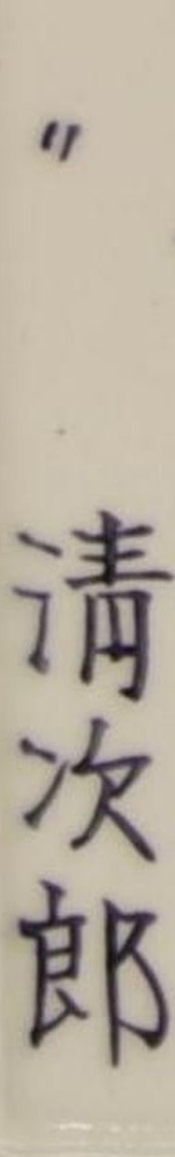清次郎
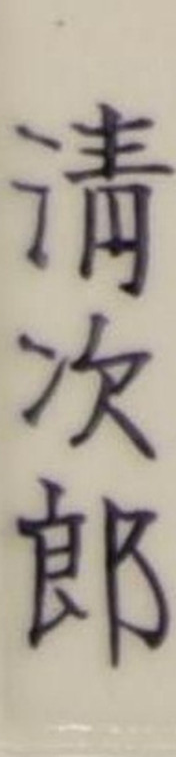清次郎
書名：E~L
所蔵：高野山金剛峯寺
